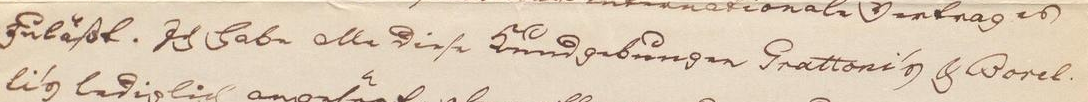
zuläßt. Ich habe alle diese Kundgebungen Grattoni's & Borel-
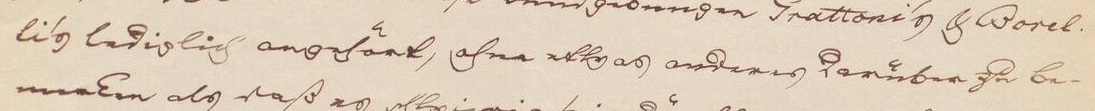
li's lediglich angehört, ohne etwas anderes darüber zu be-
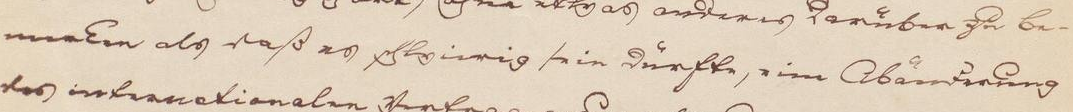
merken als dass es schwierig sein dürfte, eine Abänderung
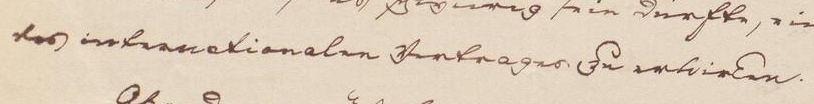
des internationalen Vertrages zu erwirken.
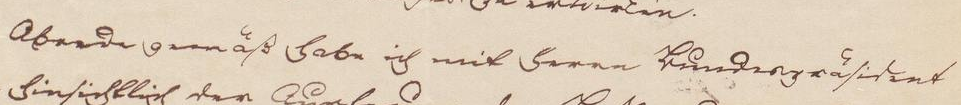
Abrede gemäss habe ich mit Herrn Bundespräsident
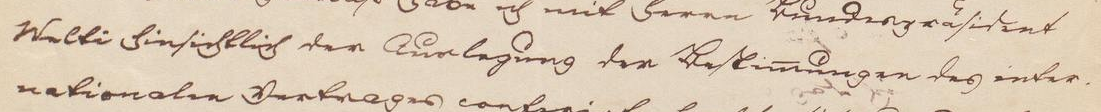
Welti hinsichtlich der Auslegung der Bestimmungen des inter-
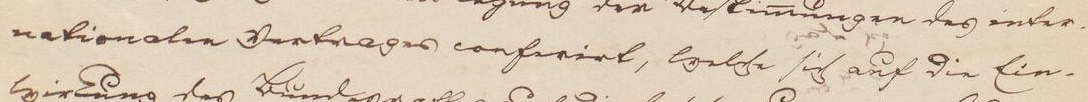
nationalen Vertrages conferirt, welche sich auf die Ein-
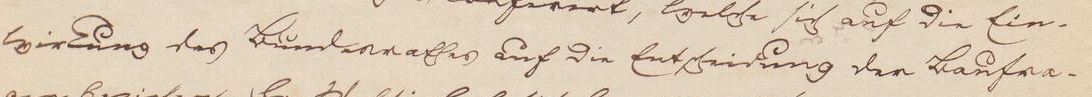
wirkung des Bundesrathes auf die Entscheidung der Baufra-
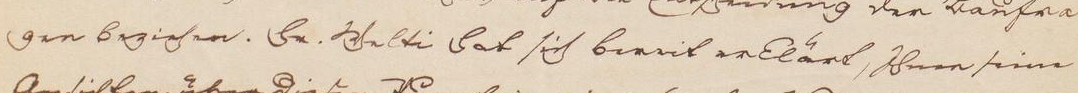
gen beziehen. Hr. Welti hat sich bereit erklärt, Ihnen seine
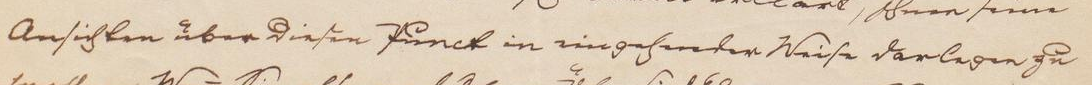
Ansichten über diesen Punct in eingehender Weise darlegen zu
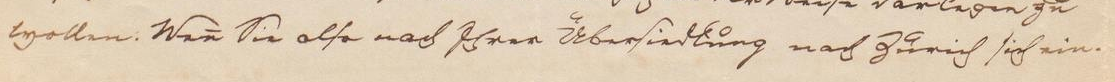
wollen. Wenn Sie also nach Ihrer Übersiedlung nach Zürich sich ein-
